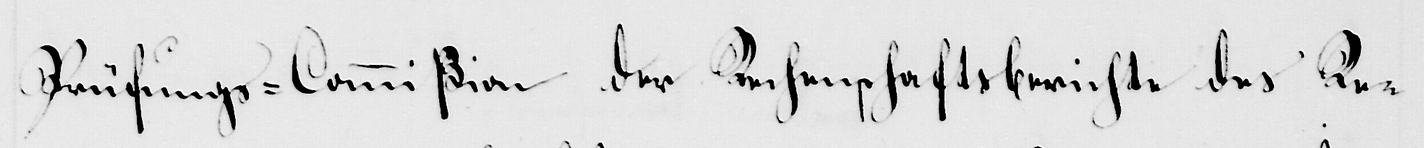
Prüfungs-Commißion der Rechenschaftsberichte des Re¬
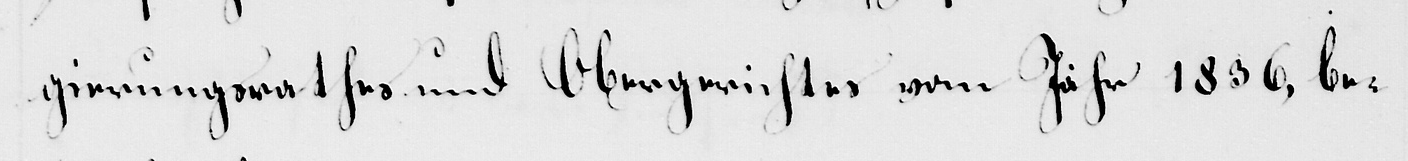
gierungsrathes und Obergerichtes vom Jahr 1836, be¬
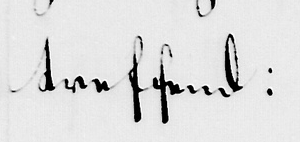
treffend:
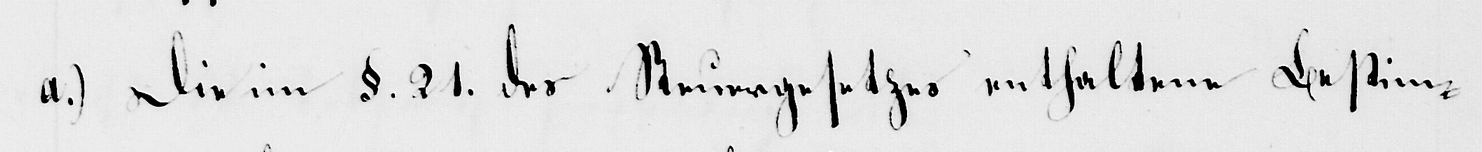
a.) Die im §. 21. des Steuergesetzes enthaltene Bestimm¬
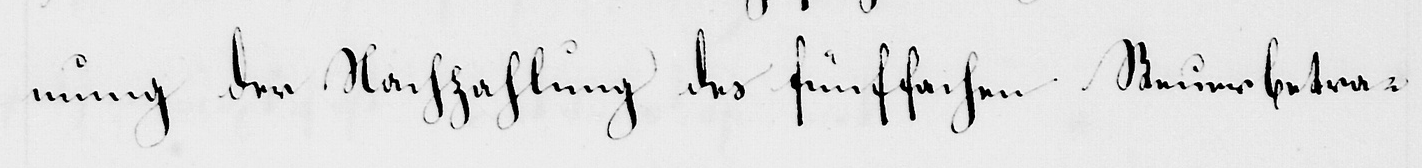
ung der Nachzahlung des fünffachen Steuerbetra¬
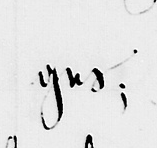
ges;
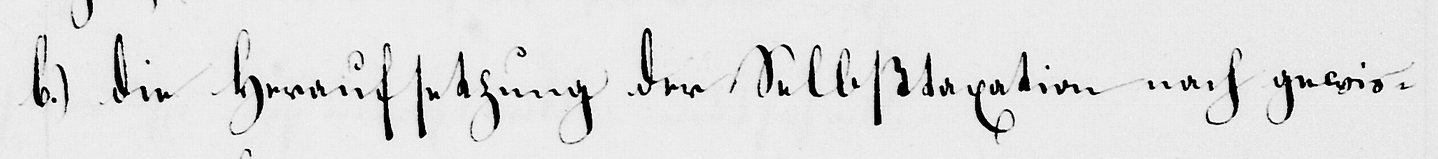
b.) Die Heraufsetzung der Selbsttaxation nach gewis¬
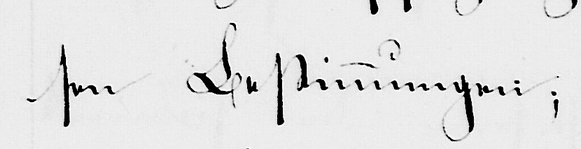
sen Bestimmungen;
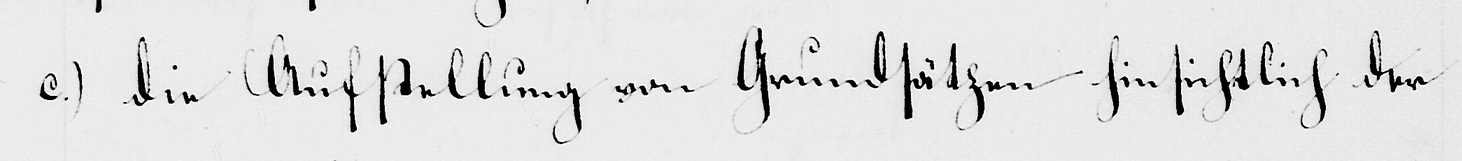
c.) Die Aufstellung von Grundsätzen hinsichtlich der
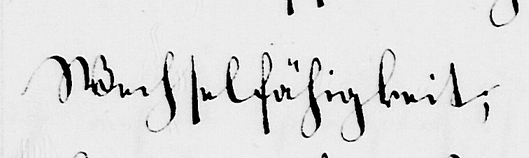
Wechselfähigkeit;
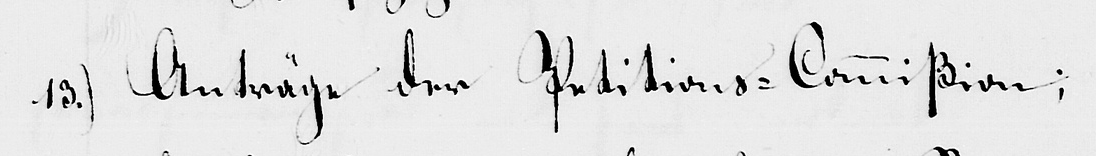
13.) Anträge der Petitions-Commißion;
